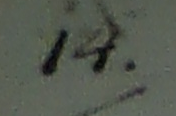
14.
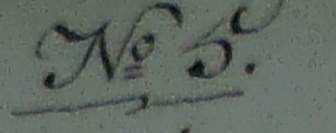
No͇ 5.
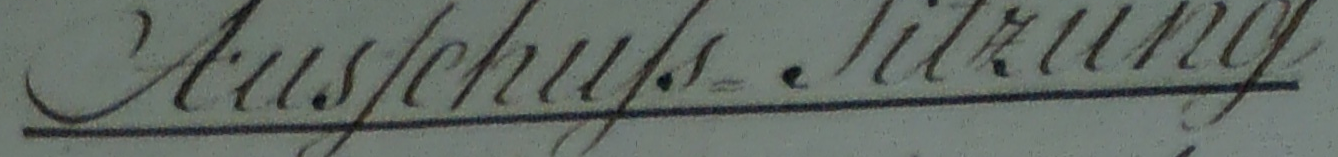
Ausschuss‗Sitzung
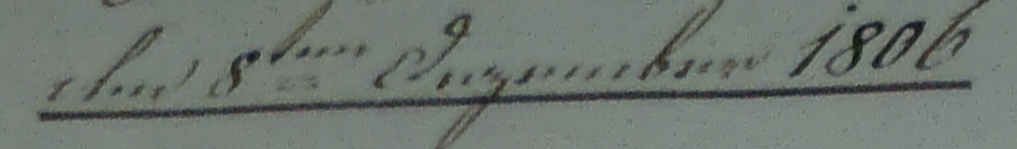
den 8te͇n Dezember 1806
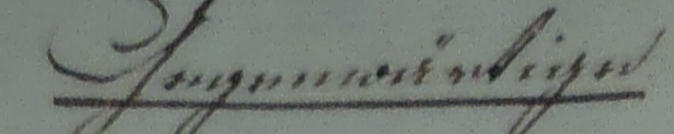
Gegenwärtige
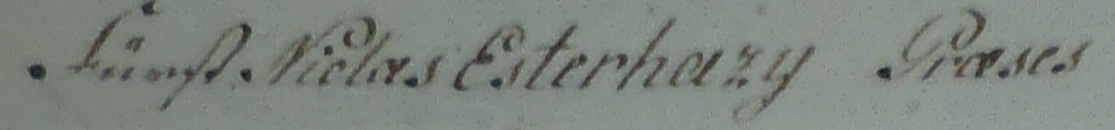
Fürst Niclas Esterhazy Præses
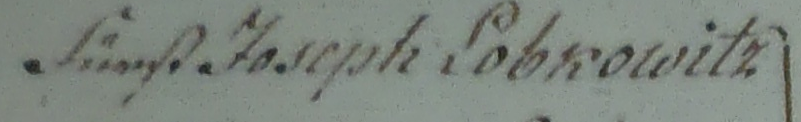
Fürst Joseph Lobkowitz
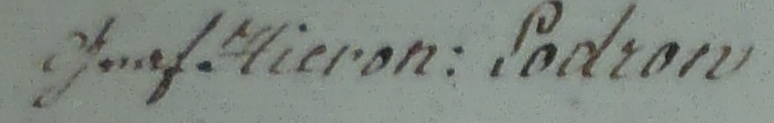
Graf Hieron: Lodron
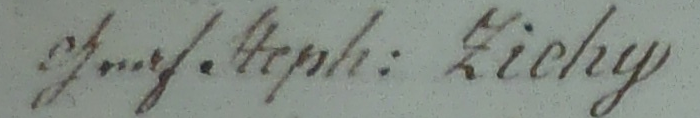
Graf Steph: Zichy
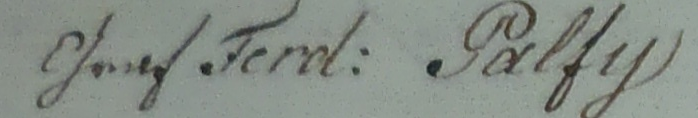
Graf Ferd: Palfy
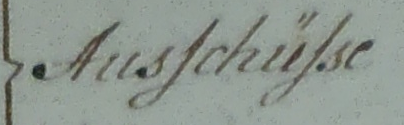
Ausschüsse
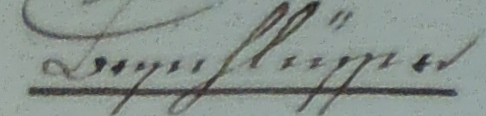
Beschlüsse
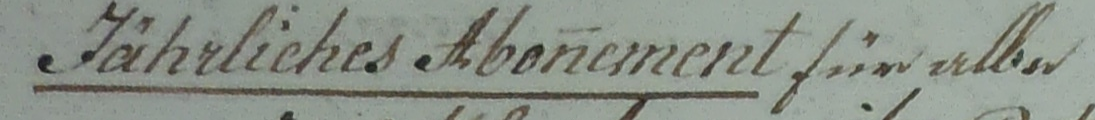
Jährliches Abon̅ement für alle
